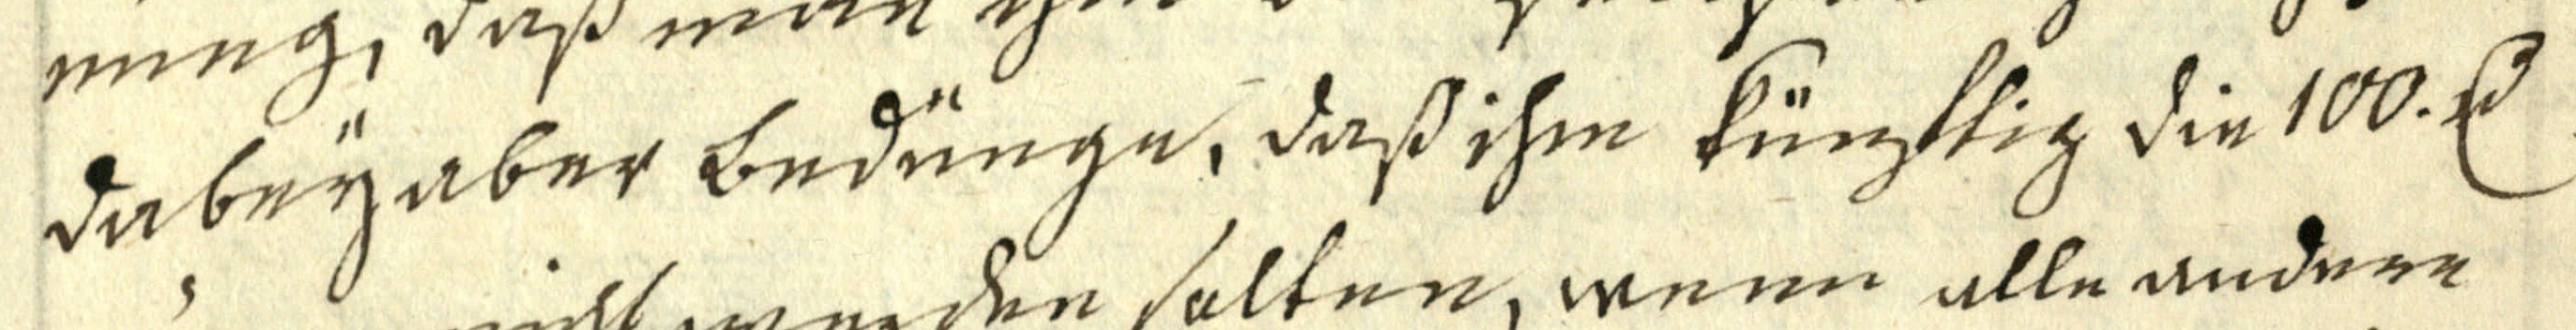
dabeÿ aber bedünge, daß ihm künftig die 100. r
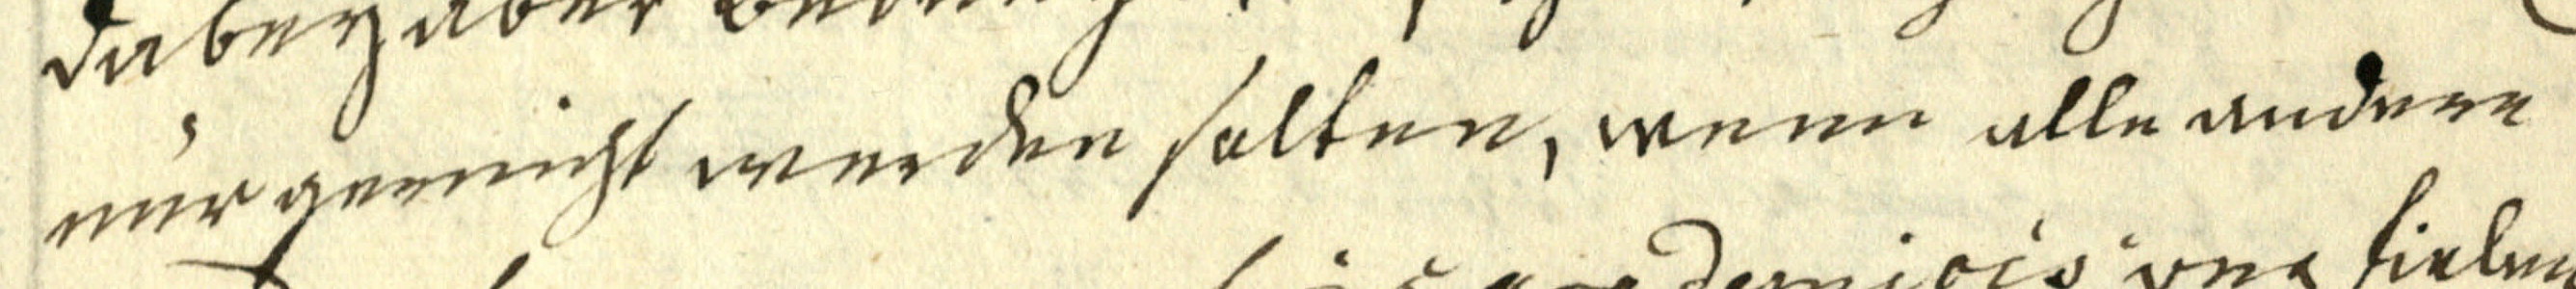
nur gereicht werden solten, wenn alle andern
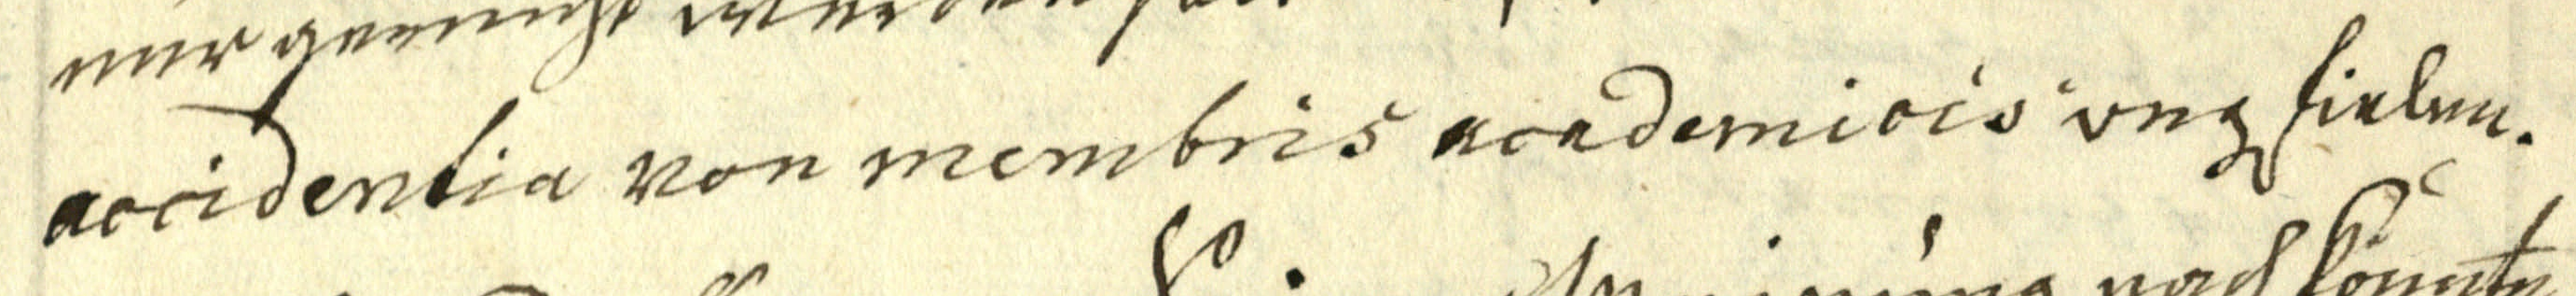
accidentia von membris Academicis wegfielen.
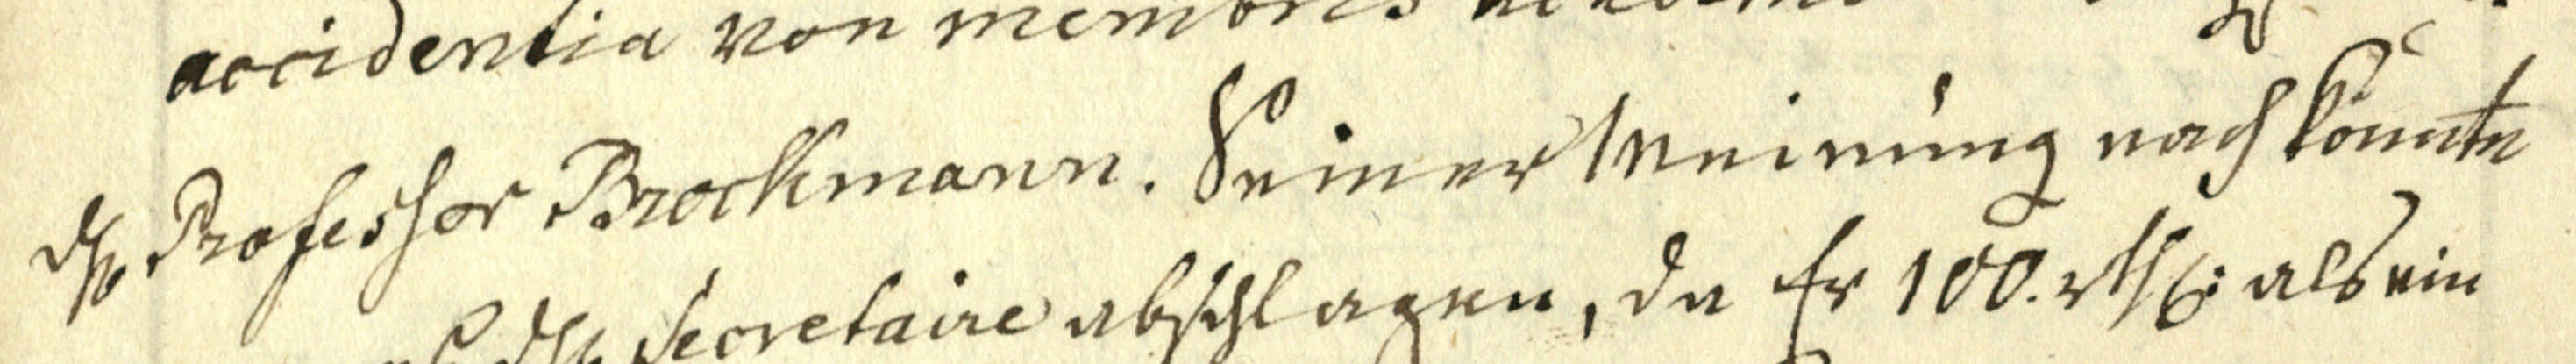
dh Professor Brockmann. Seiner Meinung nach könnte
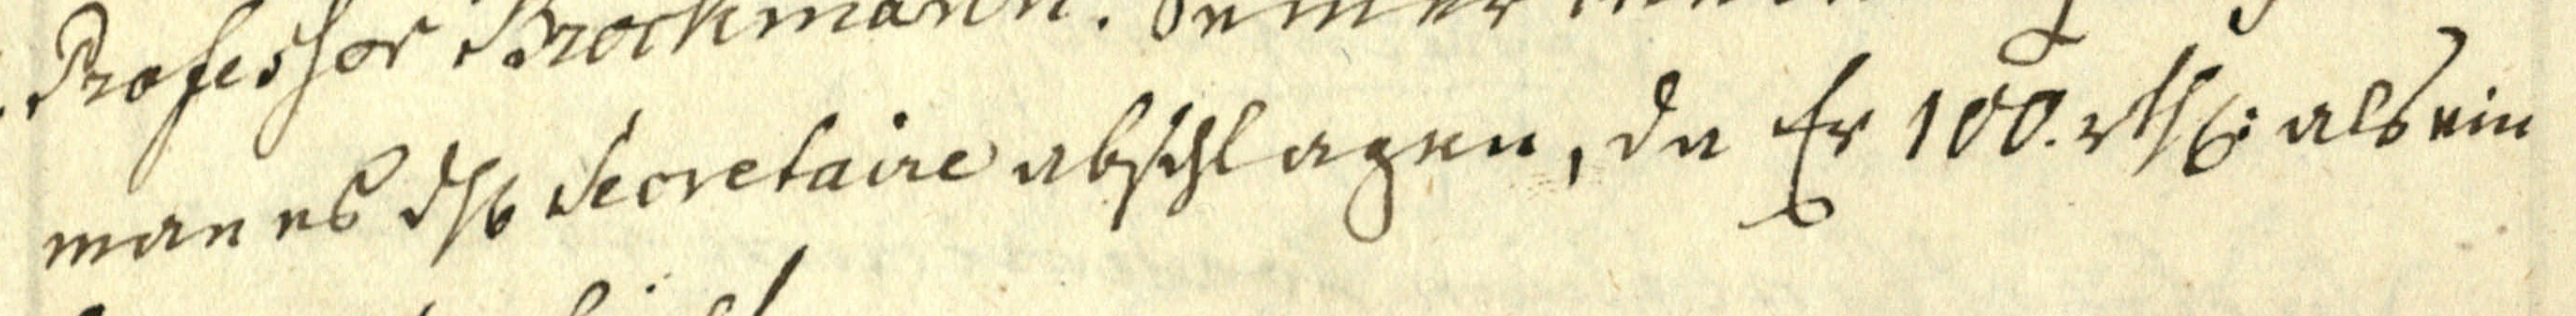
man es dh Secretaire abschlagen, da Er 100 rth als ein
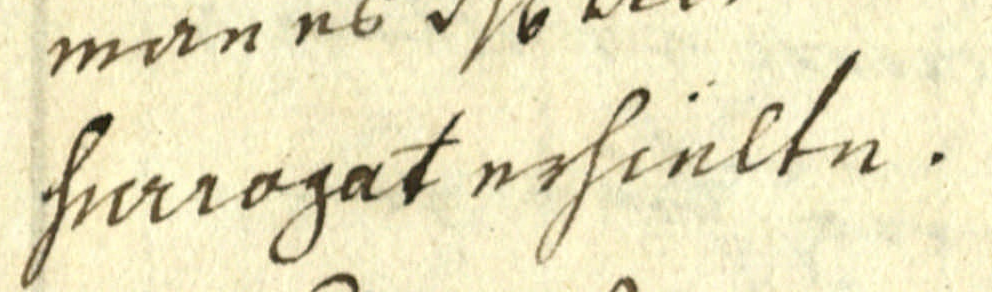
Surrogat erhielte.
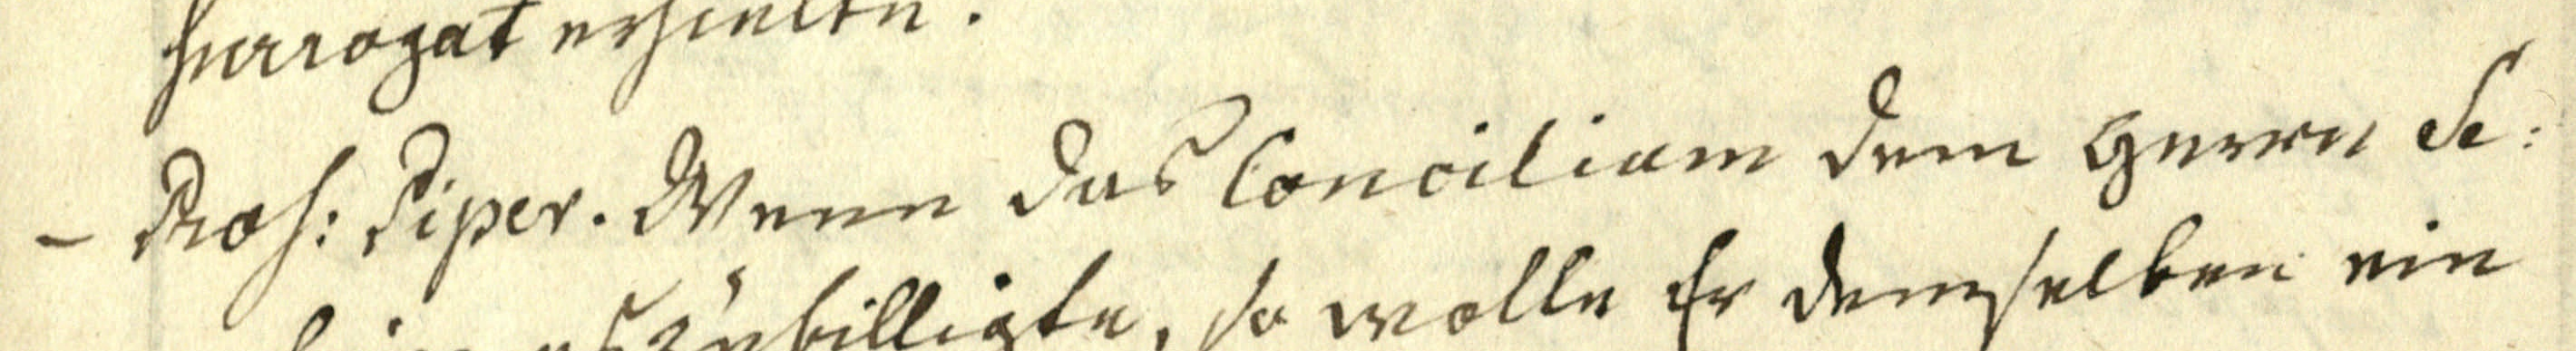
Prof. Piper. Wenn das Concilium dem Herrn Se¬
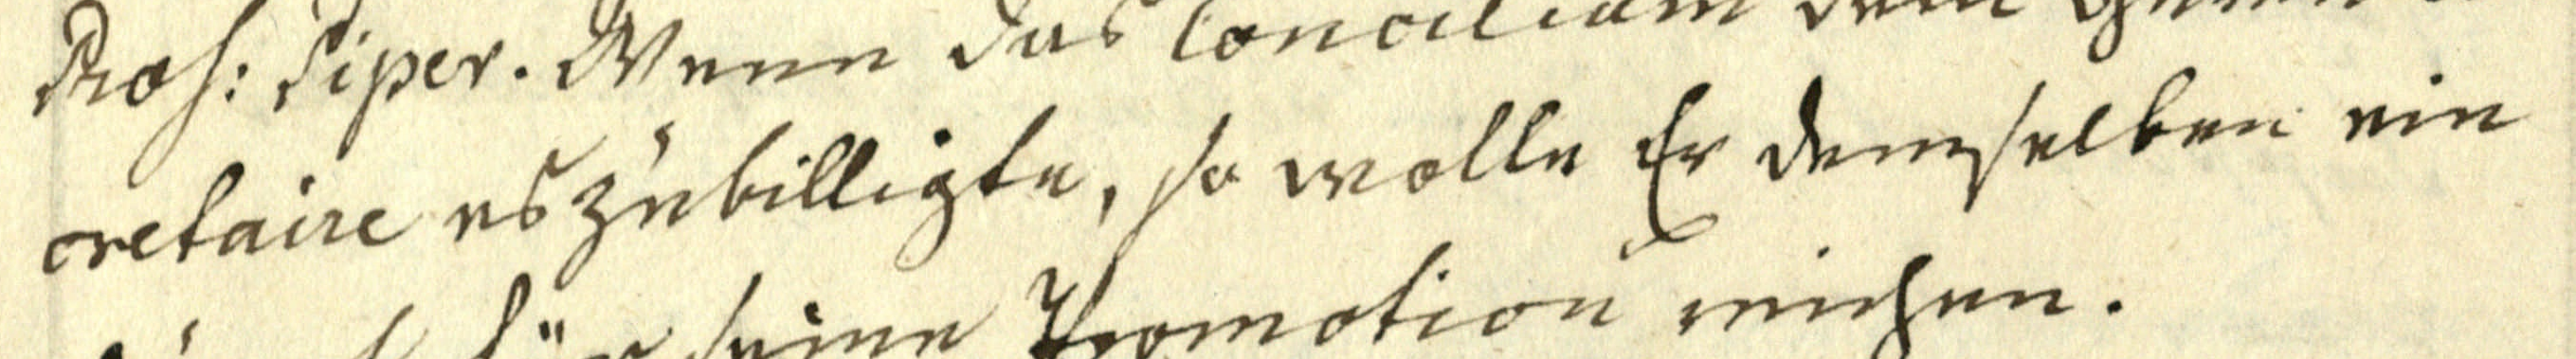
cretaire es zubilligte, so wolle Er demselben ein
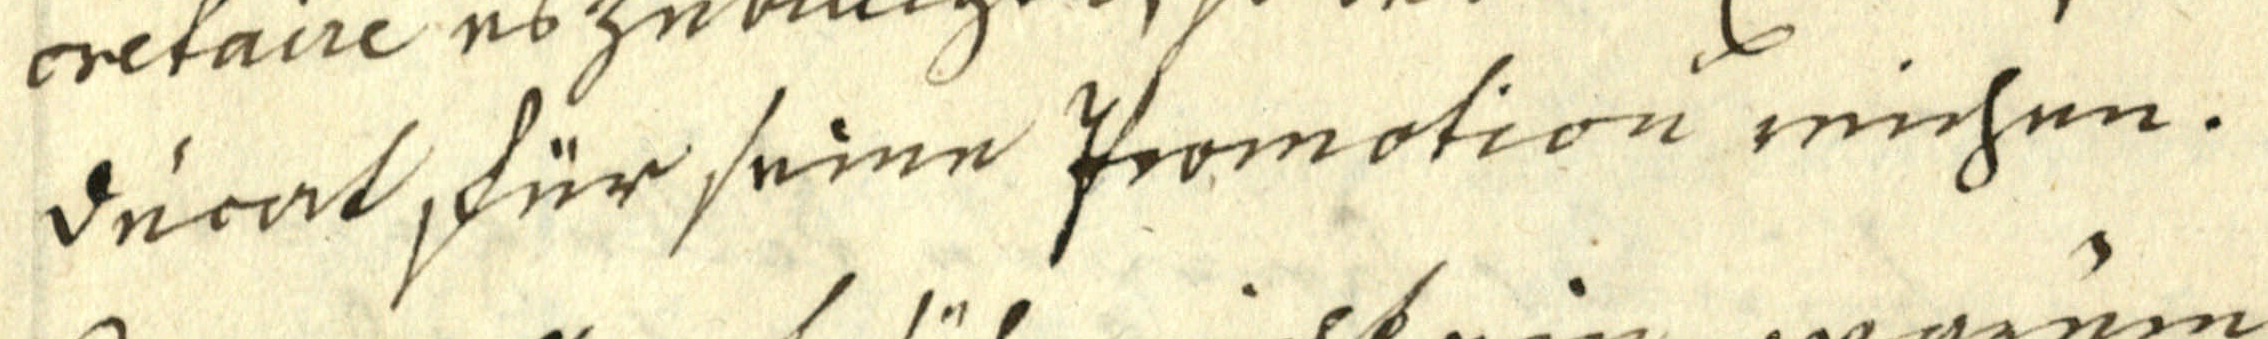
Ducat, für seine Promotion reichen.
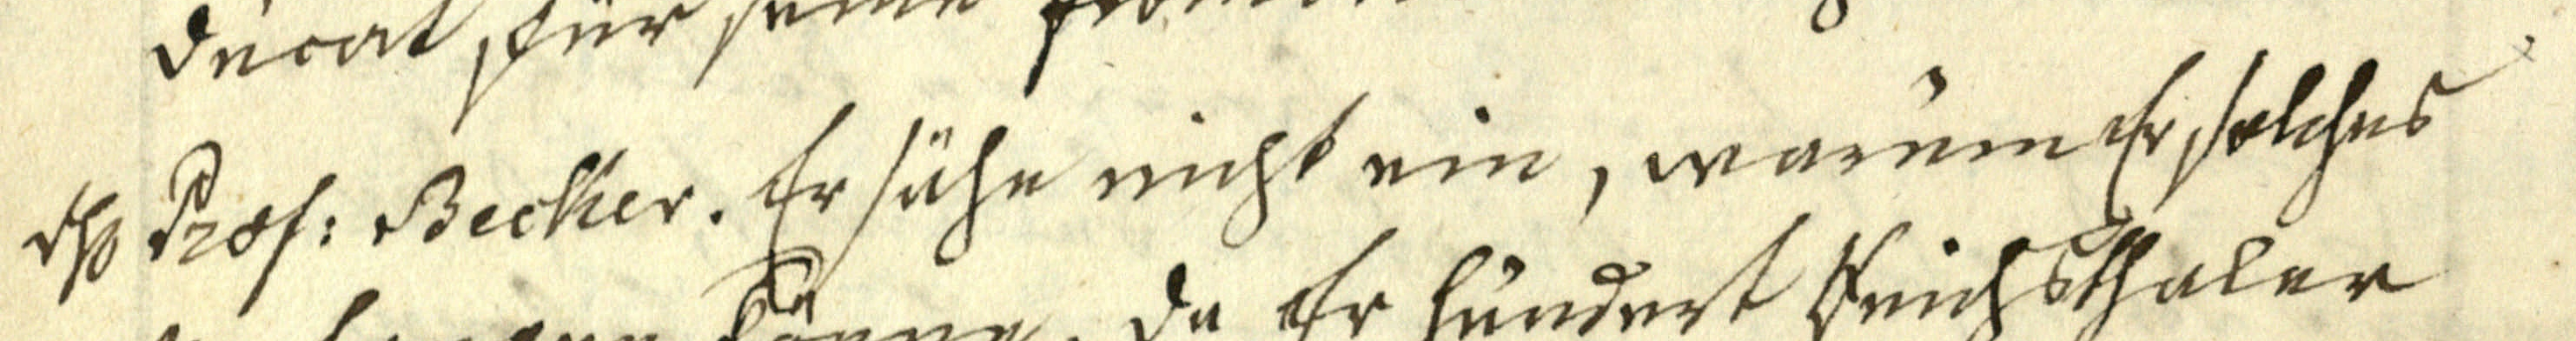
dh Prof. Becker. Er sähe nicht ein, warum Er solches
